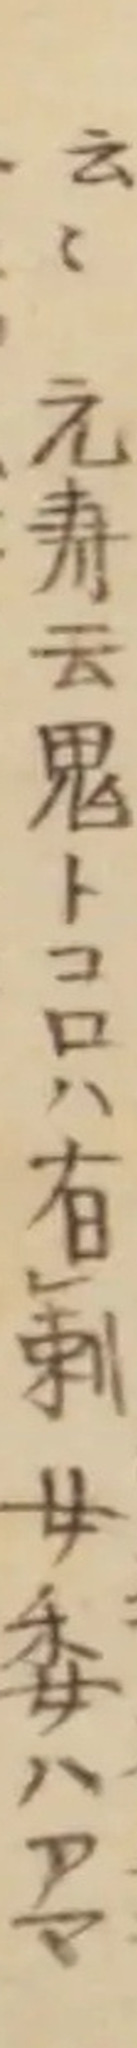云々元寿云鬼トコロハ有刺女委ハアマ

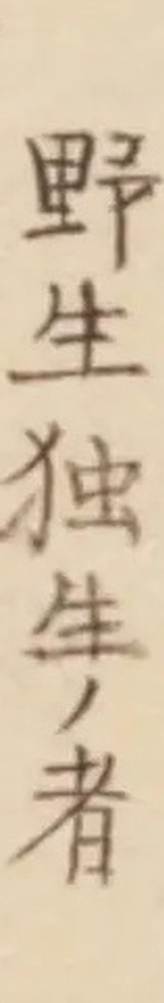野生独生の者
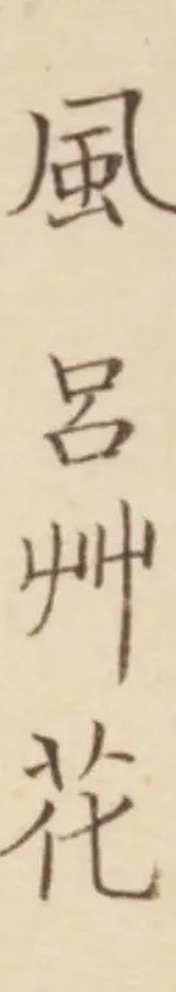風呂艸花
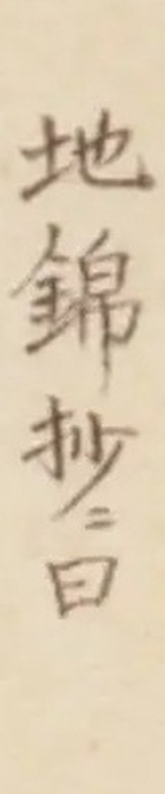地錦抄に曰
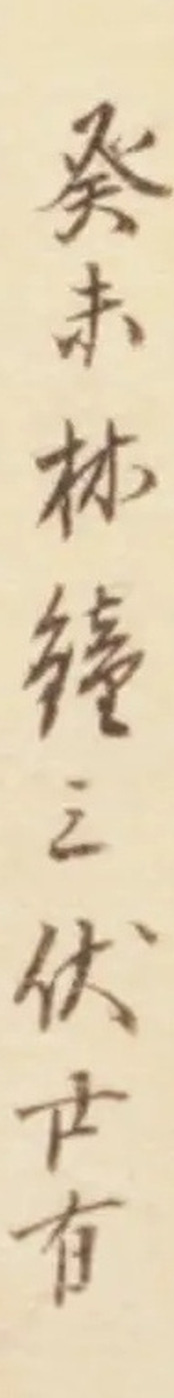癸未林鐘三伏有
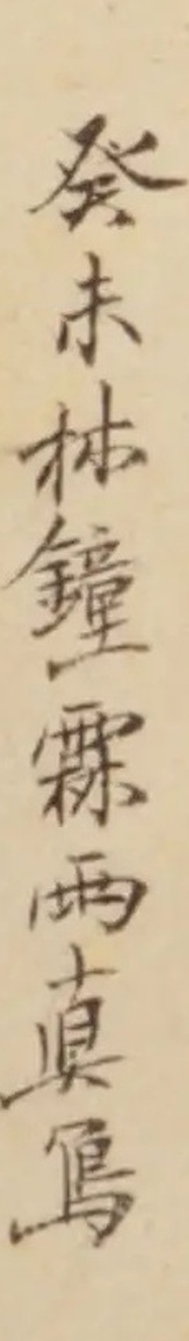癸未林鐘霖両真寫

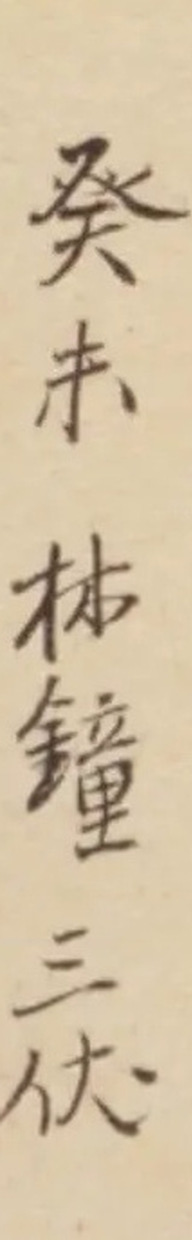癸未林鐘三伏
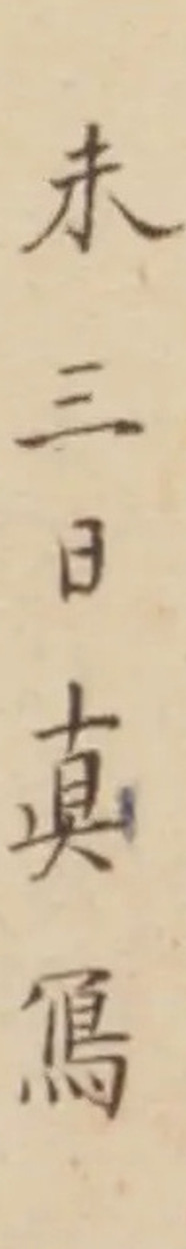未三日真寫

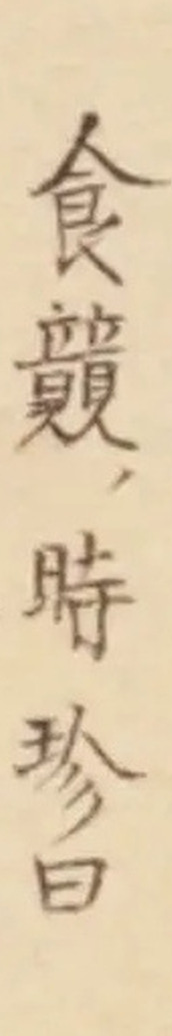食競の時珍曰
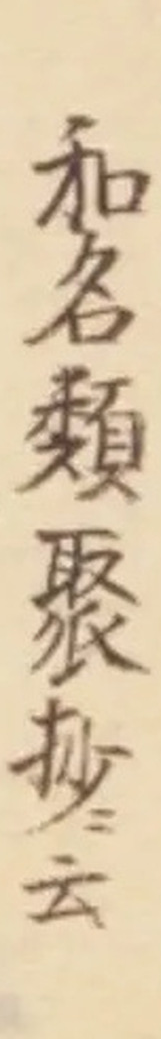和名類聚抄ニ云
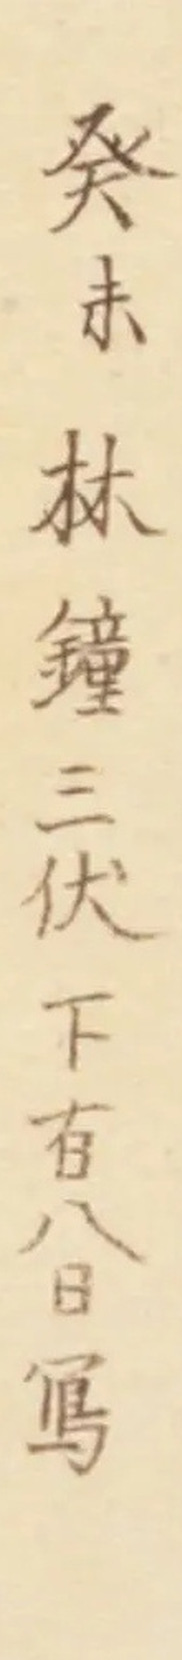癸未林鐘三伏下有八日寫
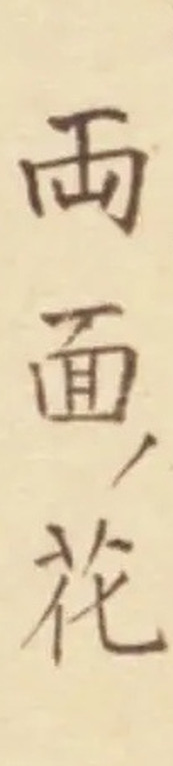両面の花
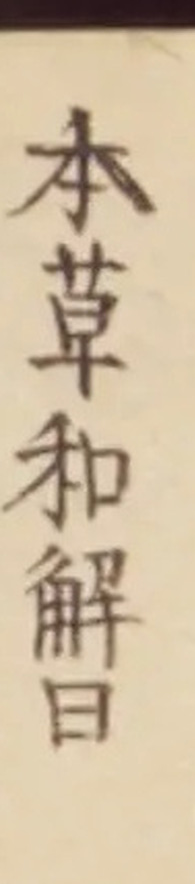本草和解曰
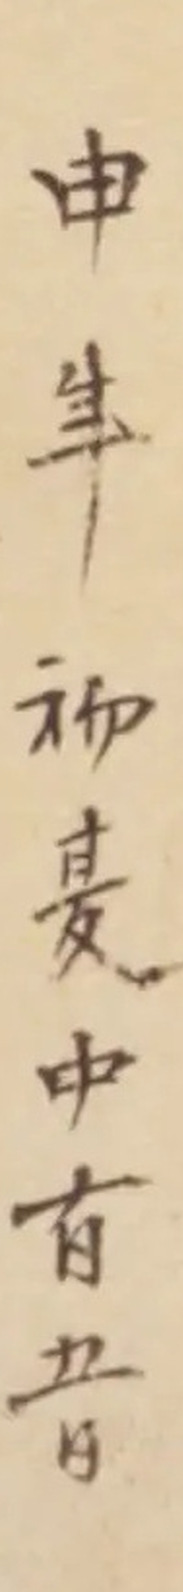申年初夏中有五日

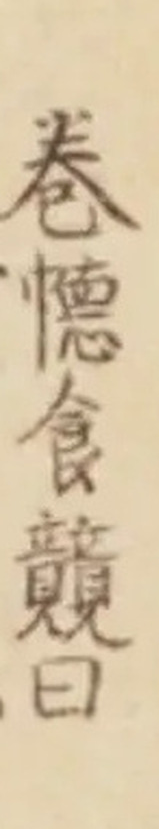巻懐食競曰
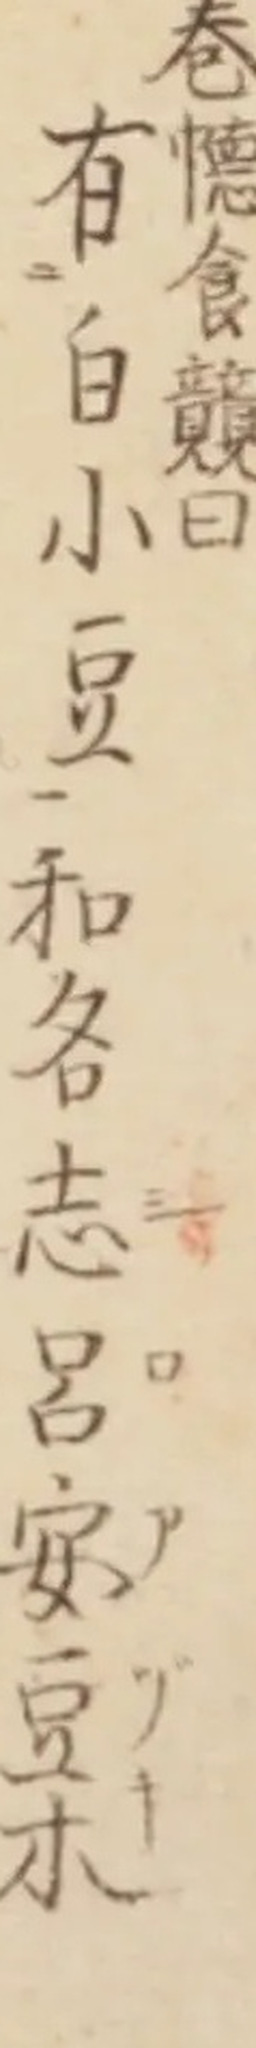有白小豆和名志呂安豆木
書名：梅園草木花譜夏之部. 2
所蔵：国立国会図書館 National Diet Library, JAPAN
